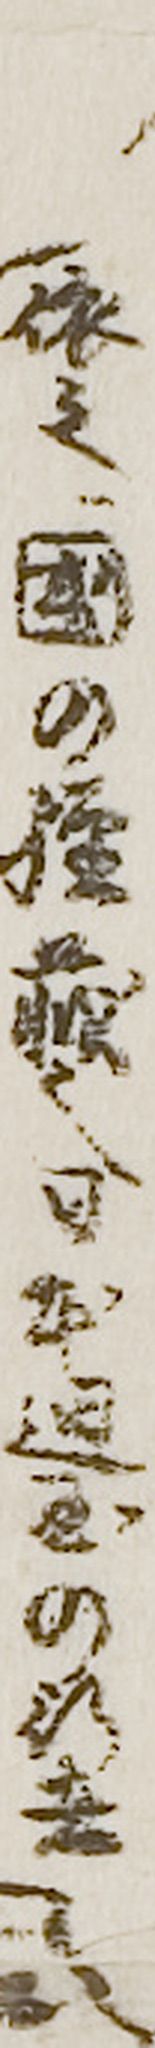依之一国の経蔵也日本廻国の行者
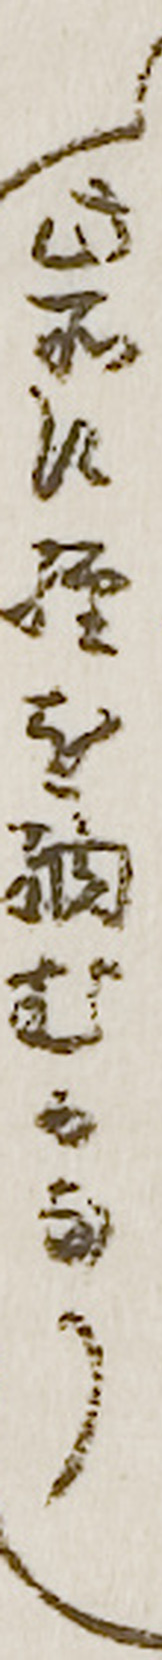此所に経を納むるなり
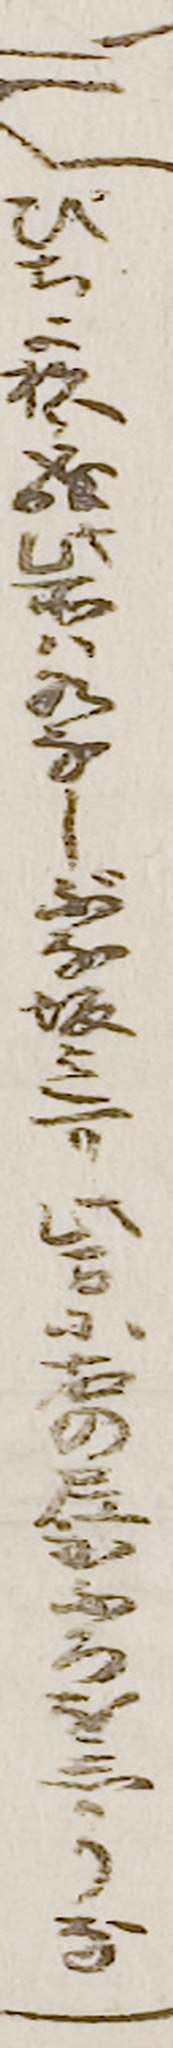びちよ杉と成此所は水なしぶな坂迄一り此間に右の尼かふろをしかりな
